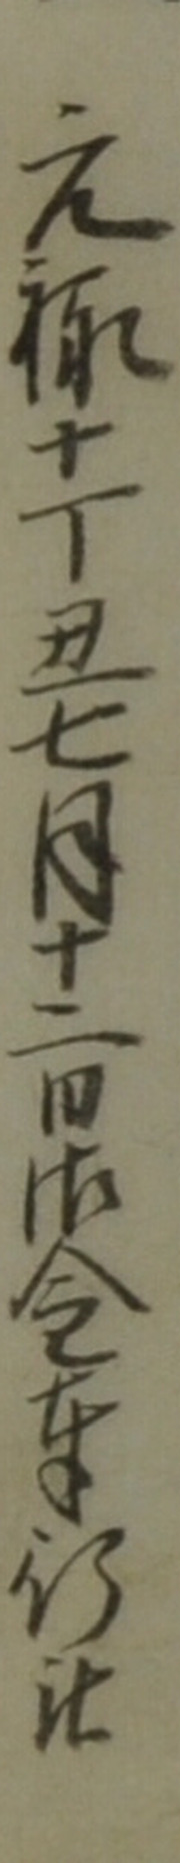一元禄十丁丑七月十二日御金奉行被

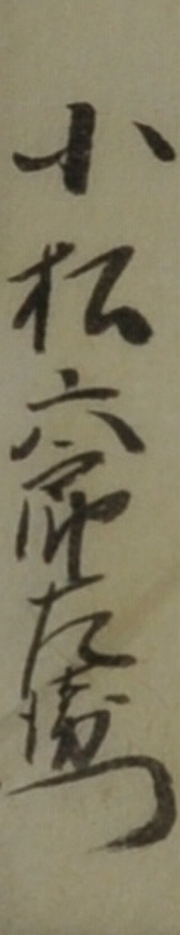小松六郎左衛門
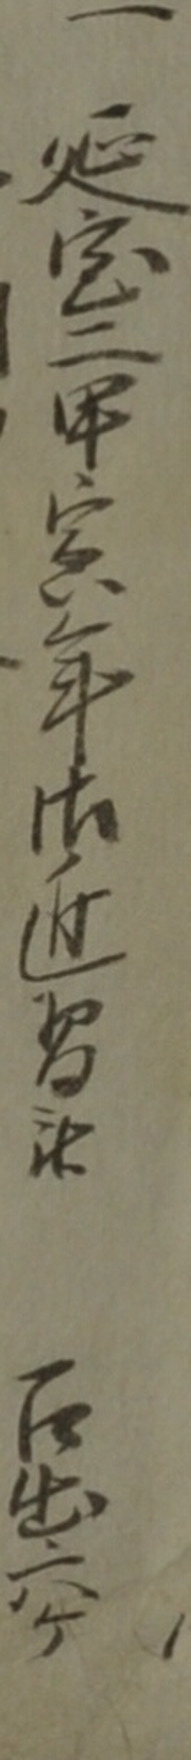一延宝二甲寅年御近習被召出六ケ
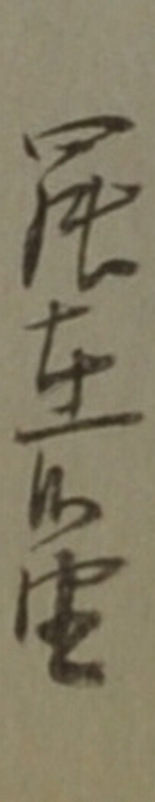罷在候由
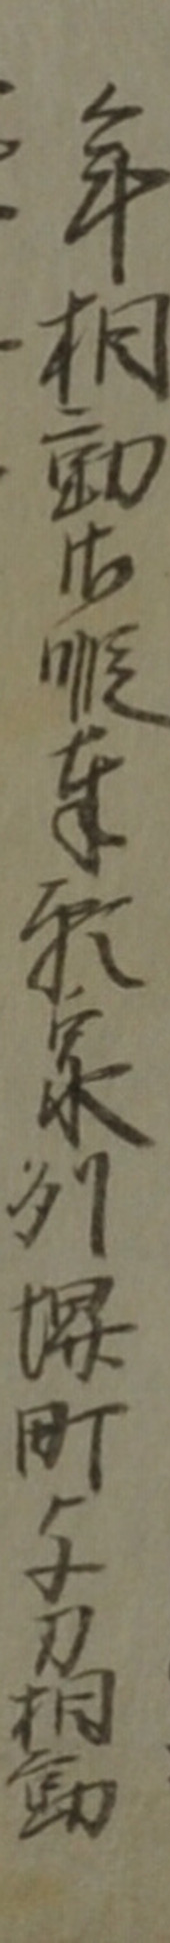年相勤御暇奉願泉州堺町与力相勤
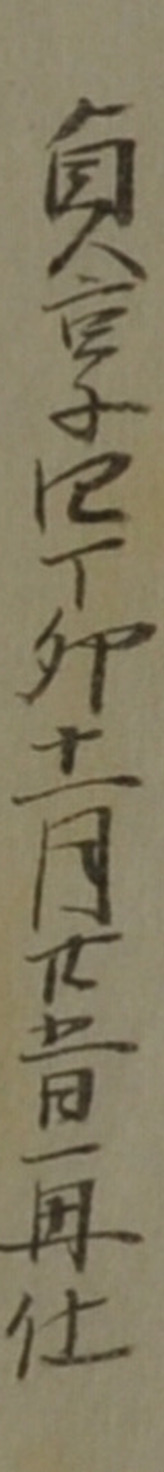貞享四丁卯十一月廿五日再仕
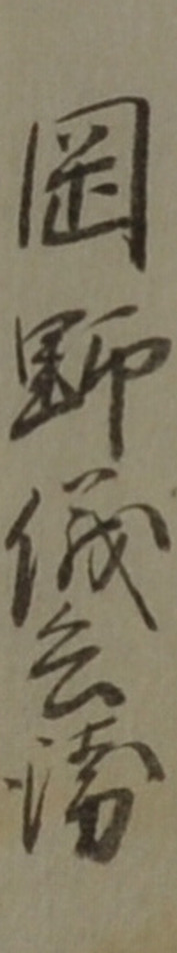岡野儀兵衛
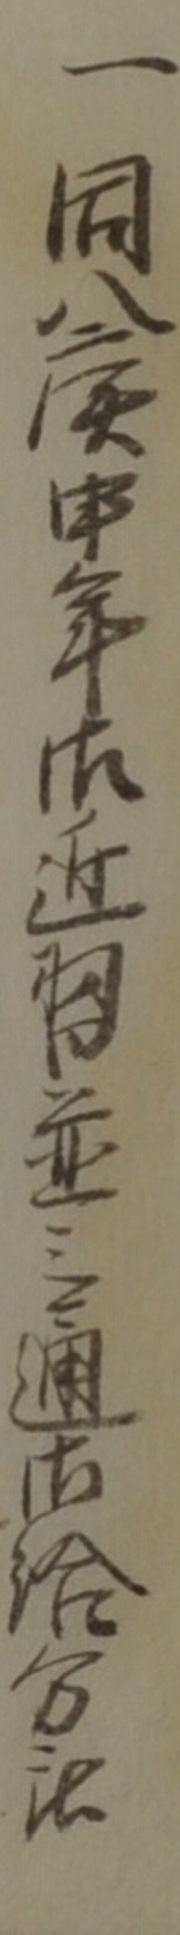一同八庚申年御近習並之通御給分被
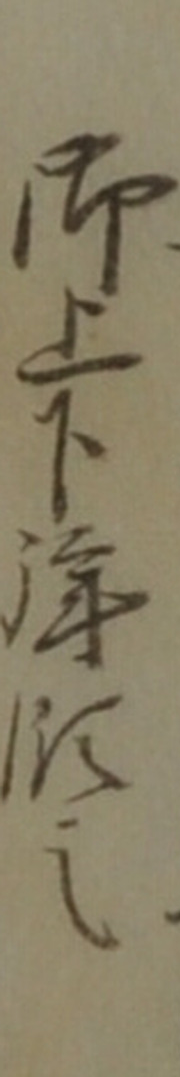御上下拝領之
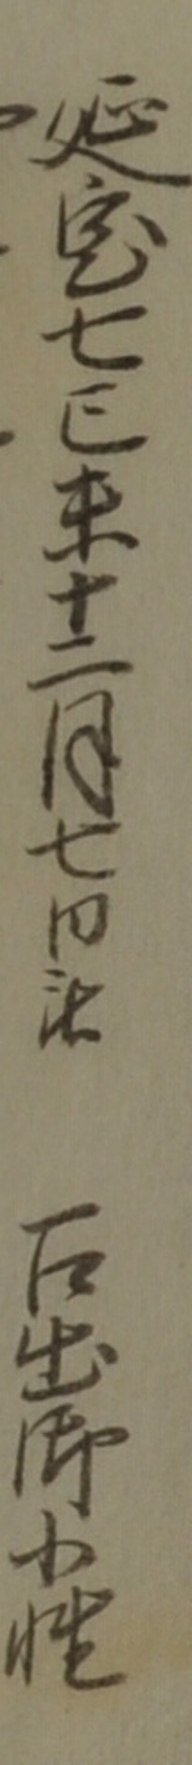一延宝七己未十二月七日被召出御小性
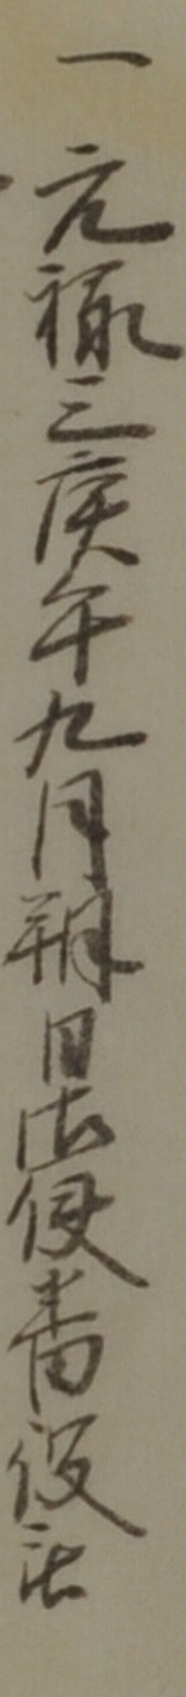一元禄三庚午九月朔日御使番役被
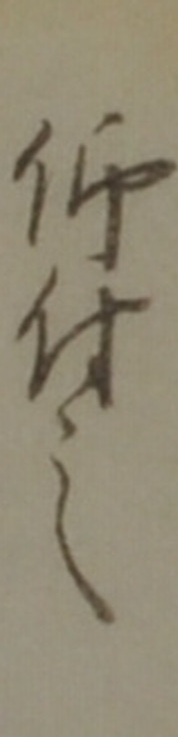仰付之
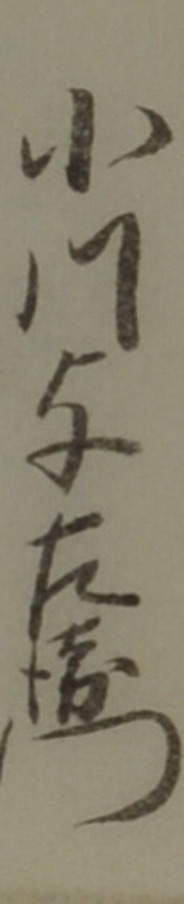小川与左衛門
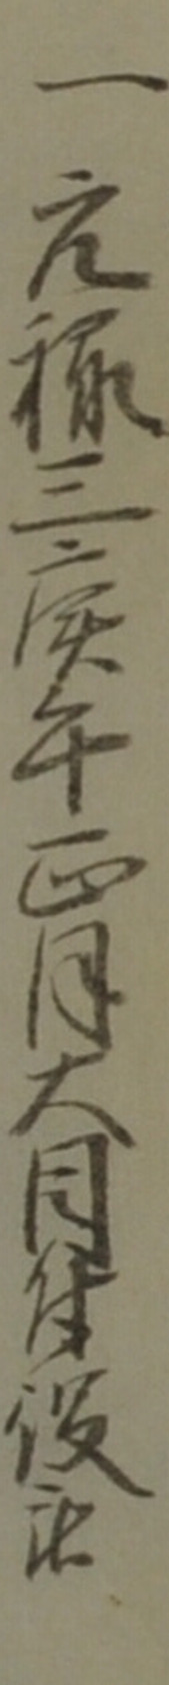一元禄三庚午正月大目付役被
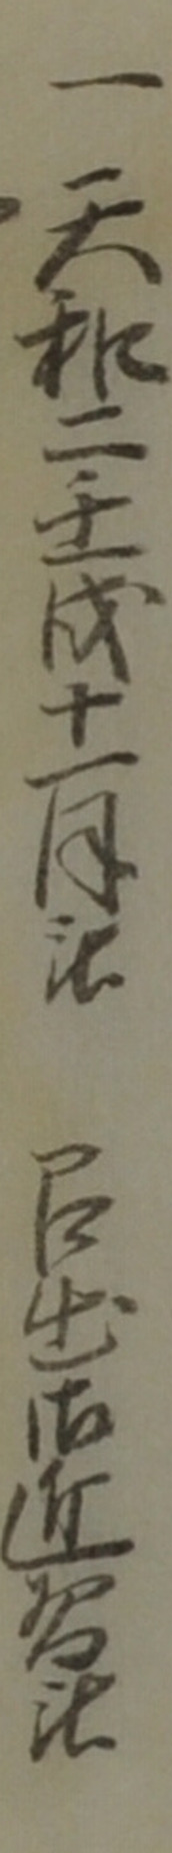一天和二壬戌十一月被召出御近習被
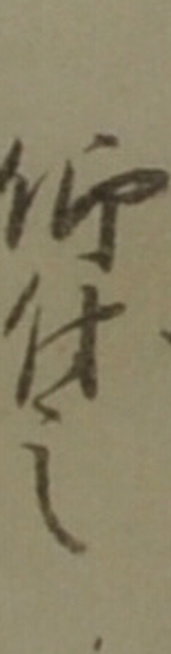仰付之
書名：諸御役代々録（五）
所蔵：伊那市立高遠町図書館・合同会社AMANE
